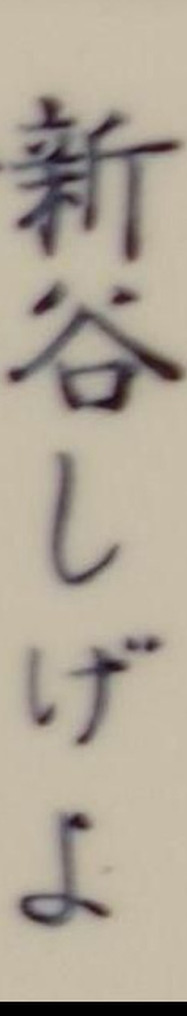新谷しげよ
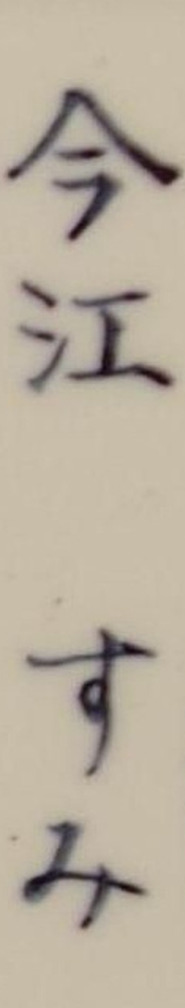今江すみ
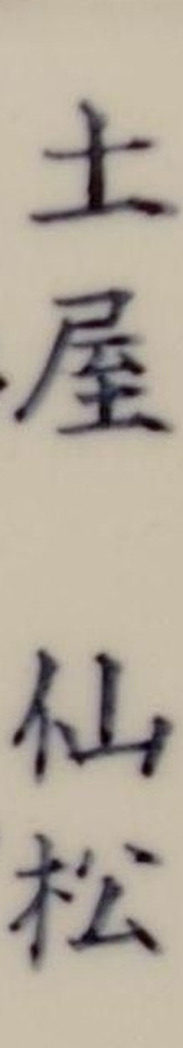土屋仙松
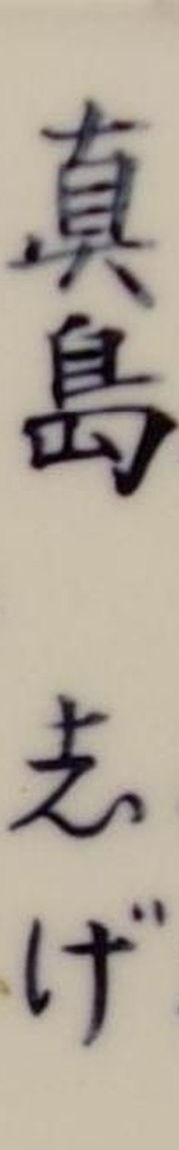真島しげ
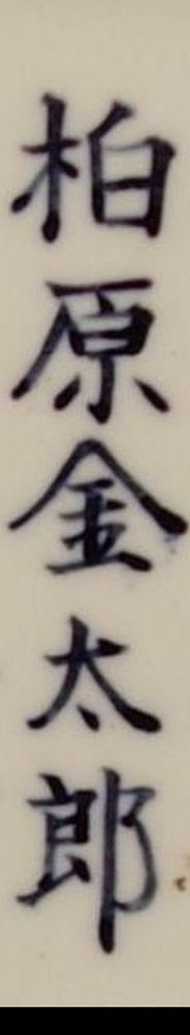柏原金太郎
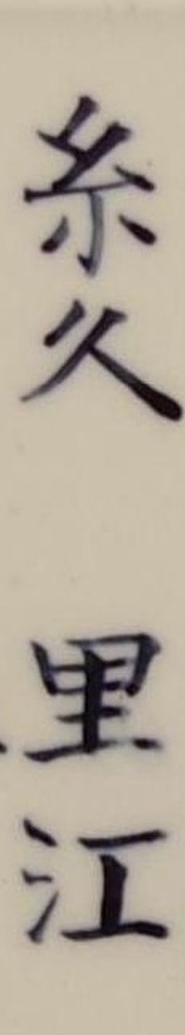糸久里江
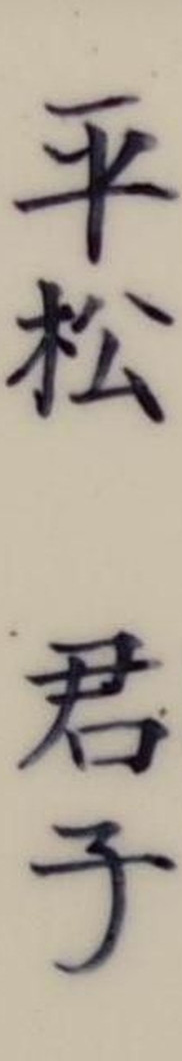平松君子
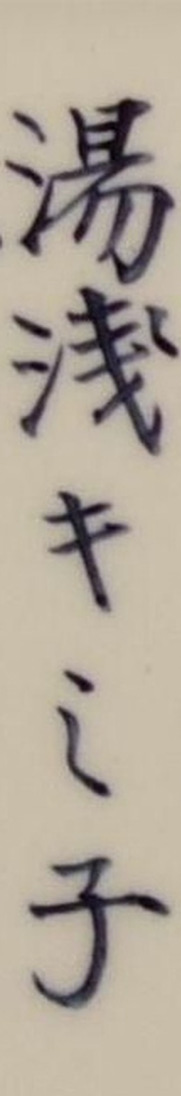湯浅キミ子
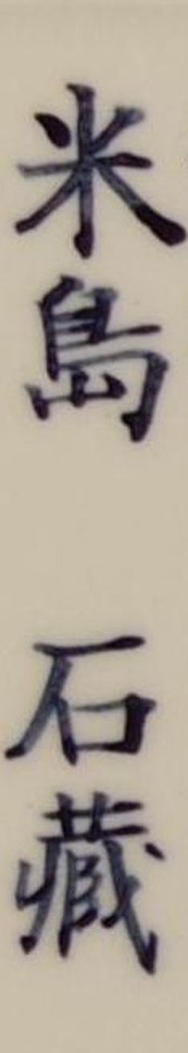米島石蔵
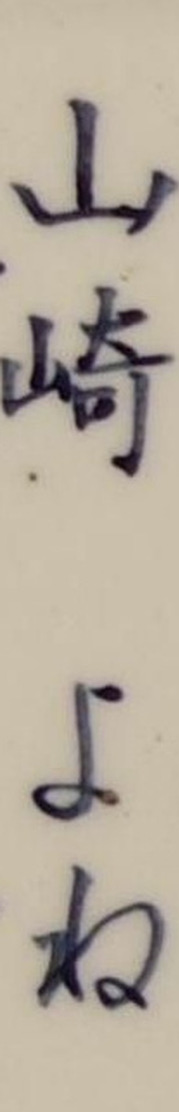山崎よね
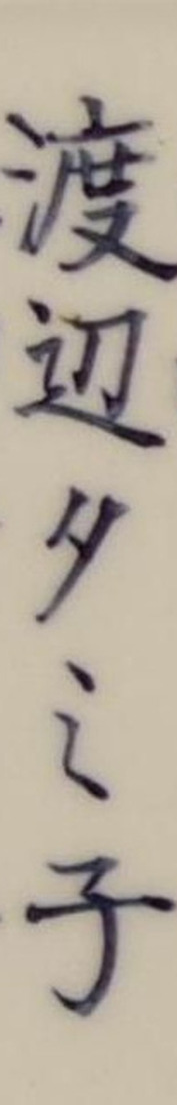渡辺タミ子
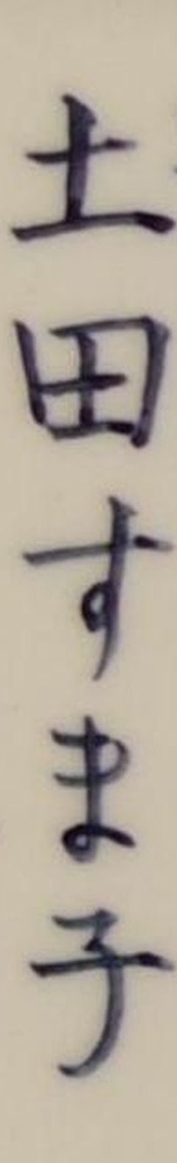土田すま子
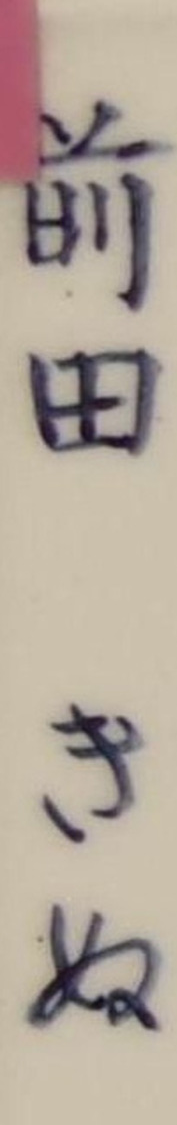前田きぬ

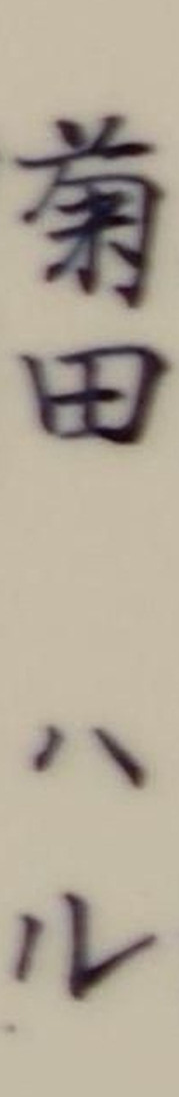菊田ハル
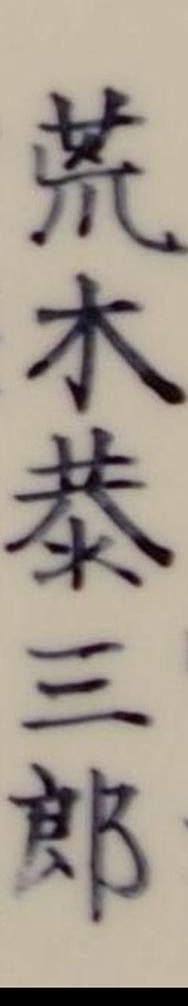荒木恭三郎
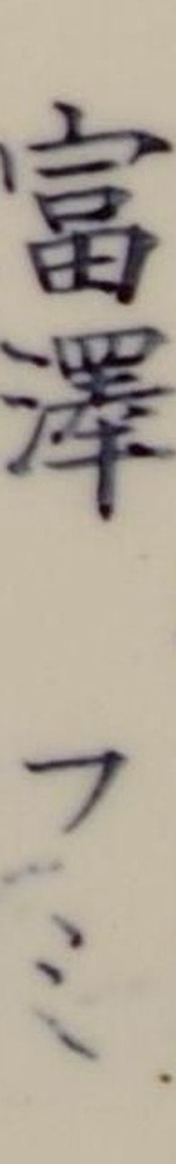富澤フミ
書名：M~S
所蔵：高野山金剛峯寺
